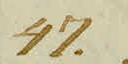47.
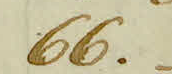66.
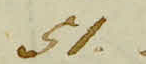51.
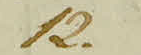12.
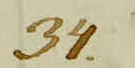34.
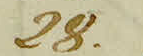28.
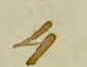4
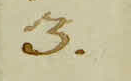3.
